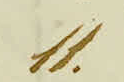11.
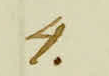4.
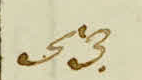53.
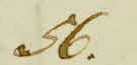56.
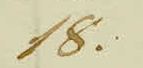18.
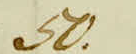50.
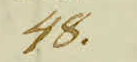48.
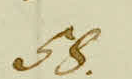58.
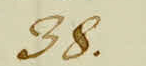38.
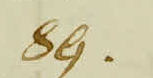89.
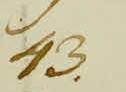43.
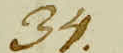34.
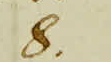8.
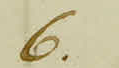6.
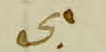5.
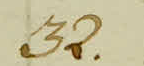32.
